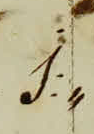1:
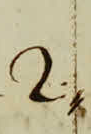2:
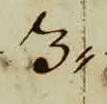3
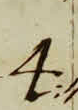4
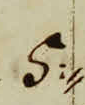5
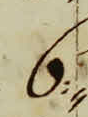6:
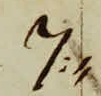7:
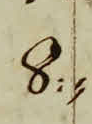8:
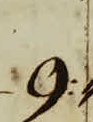9:
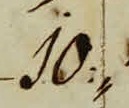10:
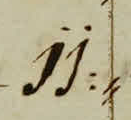11:
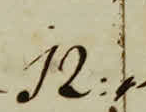12:
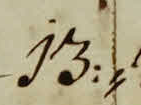13:
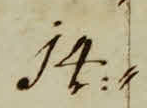14:
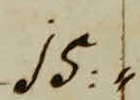15:
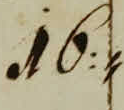16:
